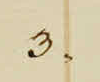3.
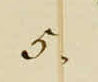5.
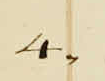4.
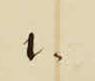1.
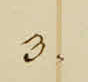3.
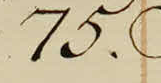75.
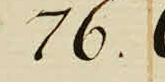76.
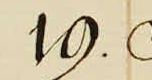19.
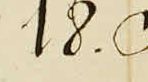18.
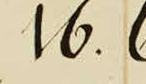16.
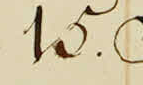15.
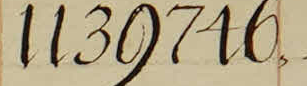1139746
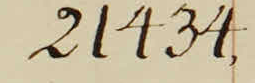21434,
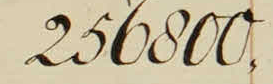256800
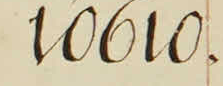10610
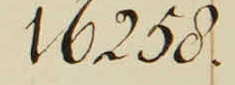16258
